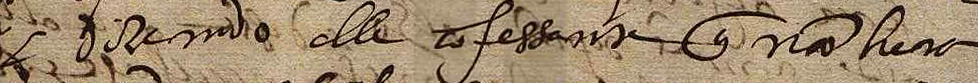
E dizendo elle c̄ofessante q̄ não hera
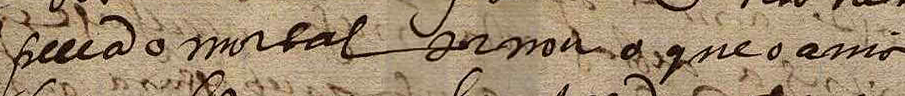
peccado mortal tornou o que o auia
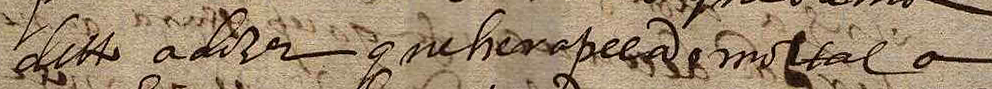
ditto a dizer que hera pecado mortal a
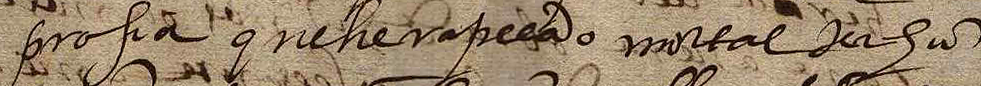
profia que hera pecado mortal ter hū
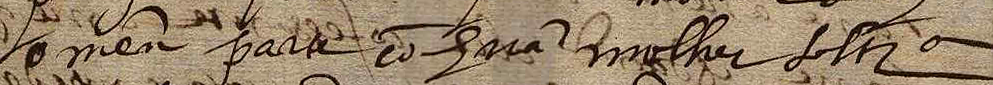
omēn parte cō huā molher soltra
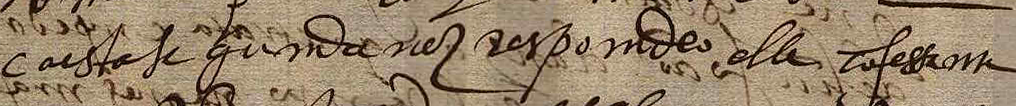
e a esta segunda uez respomdeo elle cōfessente
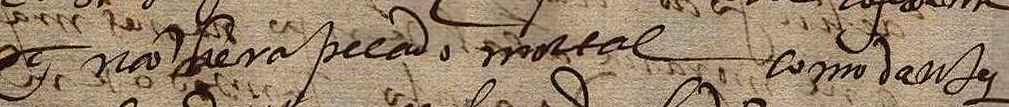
q̄ naõ hera pecado mortal como dantes
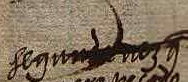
segunda uez q̄
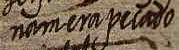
nam era pecado
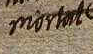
mortal
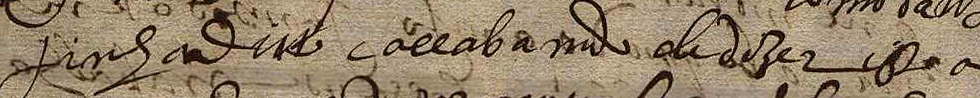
tinha ditto e accabando de dizer isto a
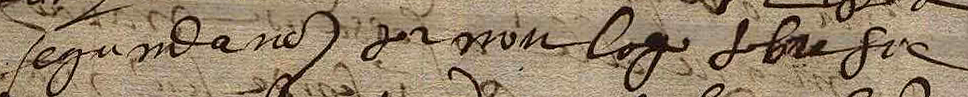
segunda uez tornou logo sobre si e
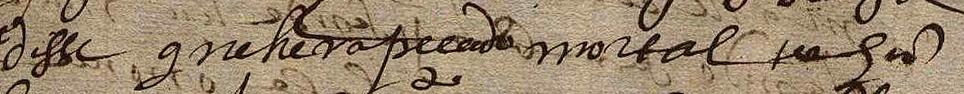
disse que hera pecado mortal ter hū
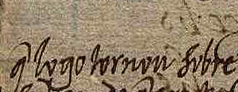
q̄ logo tornou sobre
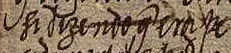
si dizendo q̄ era pe
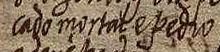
cado mortal e pedio
